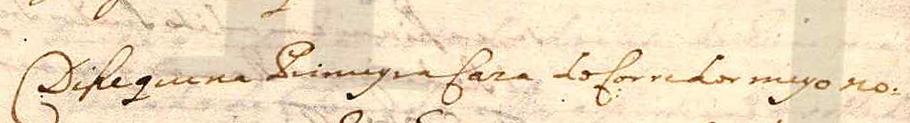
Disse que na Primeyra Caza do Corredor meyo no
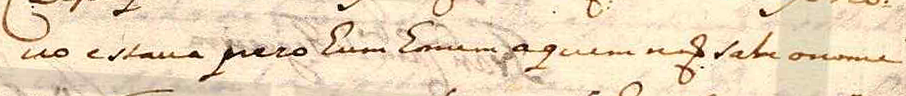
uo estaua prezo hum homem a quem naõ sabe o nome
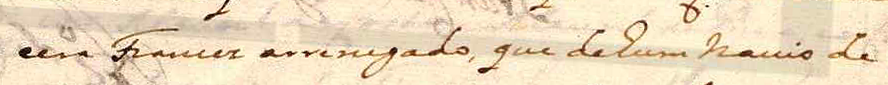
e era Francez arrenegado, que de hum Nauio de
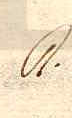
R.
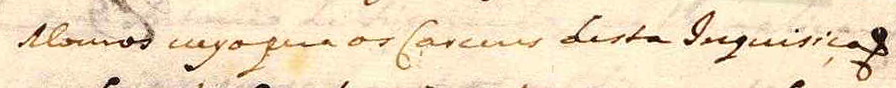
Mouros ueyo pera os Carceres desta Inquisiçaõ
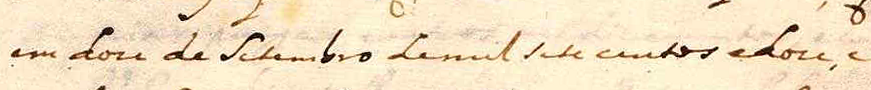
em doze de Setembro de mil setecentos e doze, e
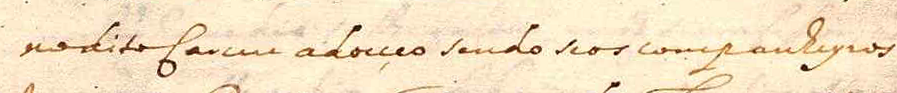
no dito Carcere adoeceo sendo seos companheyros
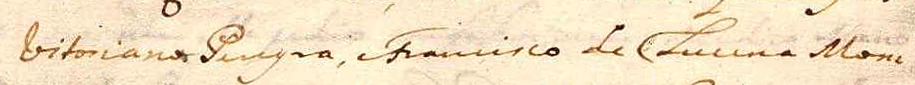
vitoriano Pereyra, e Francisco de Lucena Mon
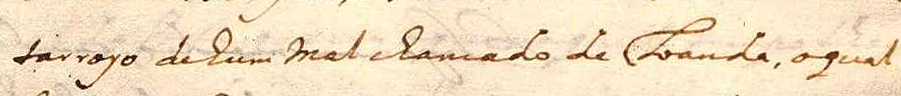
tarroyo de hum mal chamado de Loanda, o qual
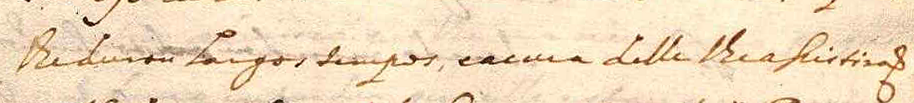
lhe durou largos tempos, e a cura delle lhe assistiraõ
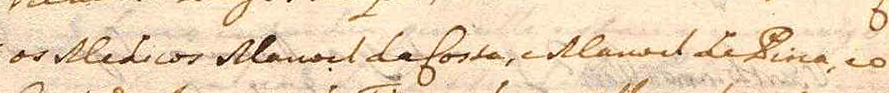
os Medicos Manoel da Costa, e Manoel da Pina, e o
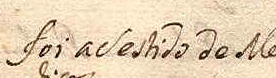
foi aSestido de Me
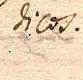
dicos.
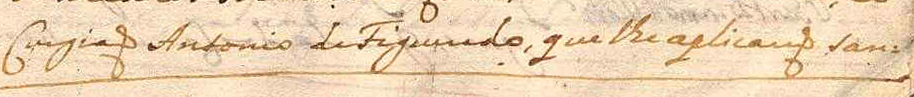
Curgiaõ Antonio de Figueiredo, que lhe aplicaraõ san
